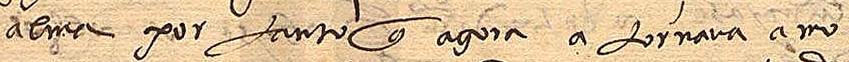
alma por tanto q̅ agora a tornaua amo
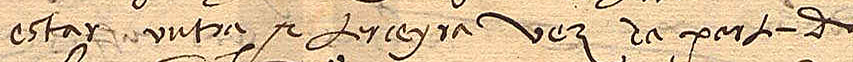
estar outra e terceyra vez da parte de
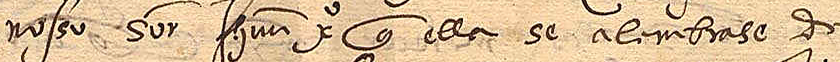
nosso so̅r Jhu̅u xo q̅ ella se alembrase de
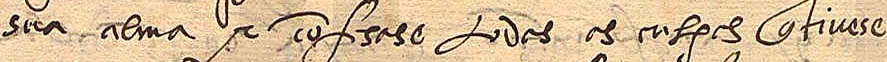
sua alma e c̅ofesase todas culpas q̅ tiuese
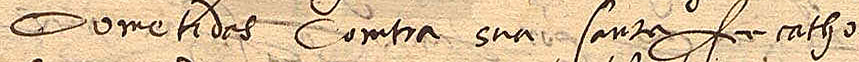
cometidas comtra sua santa fee catho
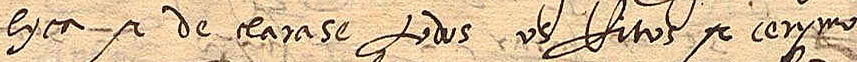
lyca e declarase todos os Ritos e cerymo
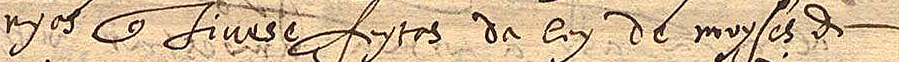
nyas q̅ tiuese feytas da ley de moyses de
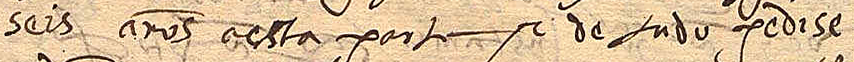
seis a̅nos a esta parte e de tudo pedise
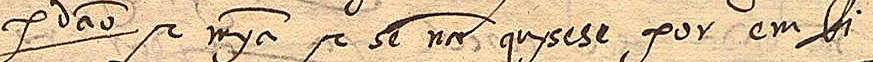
ꝑdão e my̅a e se n̅a quysese por em Ri
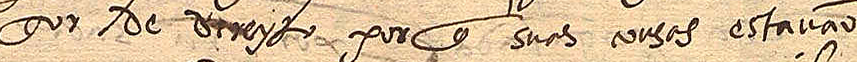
gor de direyto porq̅ suas cousas estauão
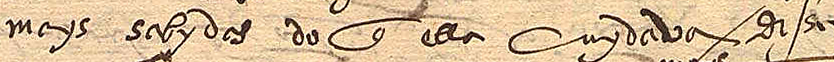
mays sabydas do q̅ ella cuydava disse
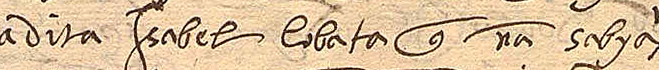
a dita Jsabel lobata q̅ n̅a sabya
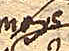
mays
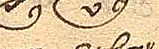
q̅ o q̅
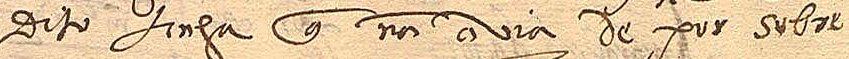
Dito tinha q̅ n̅a avia de por sobre
